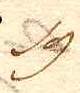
sós
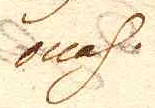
occas.
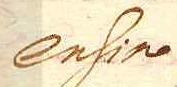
ensino
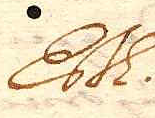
Esth.
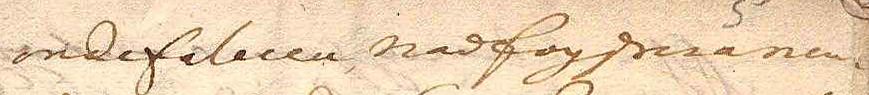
onde faleceu, naõ foy preza nem
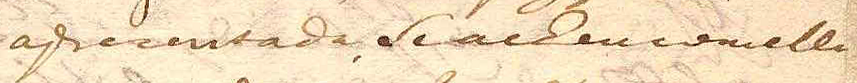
aprezentada, se achou com ella
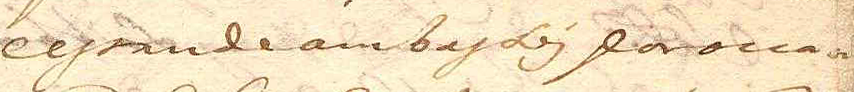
e estando ambas sós por occa
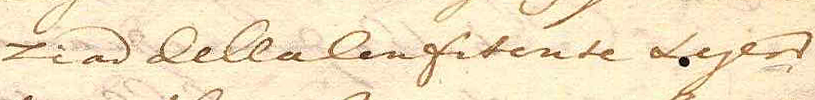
ziaõ della confitente se por
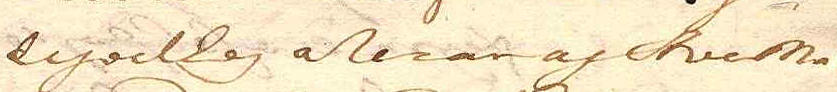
de joelhos a Rezar as Ave Ma
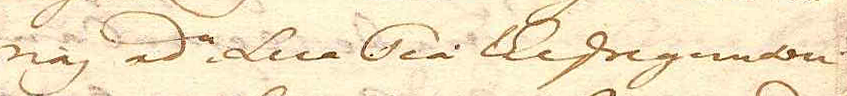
rias a da. sua Tia lhe preguntou
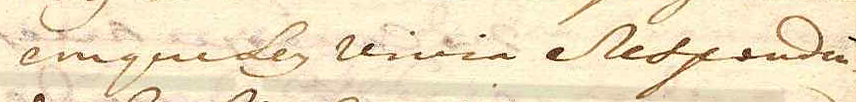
em que Ley vivia e Responden
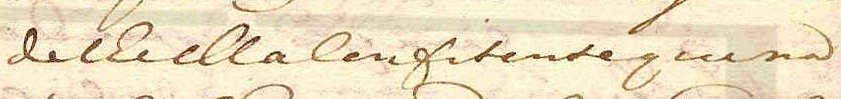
dolhe ella confitente que na
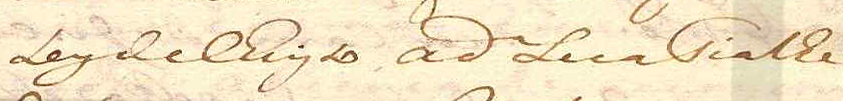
Ley de Christo a da sua Tia lhe
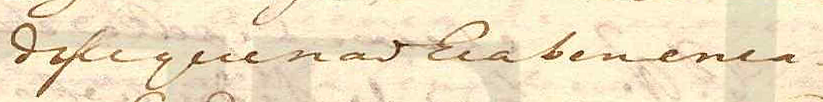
disse que naõ hia bem enca
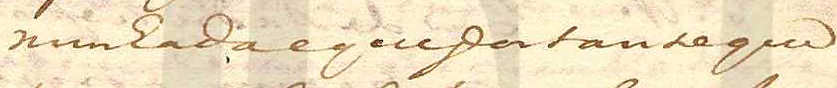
minhada e que portanto que
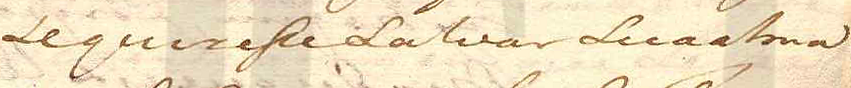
se quizesse salvar sua alma
